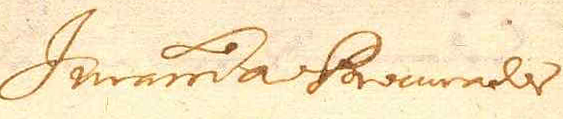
Juramto ao Procurador
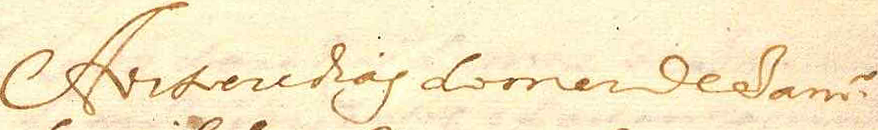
Aos tres dias do mes de Ianr.o
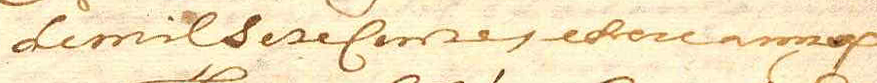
de mil seteCentos e treze annos
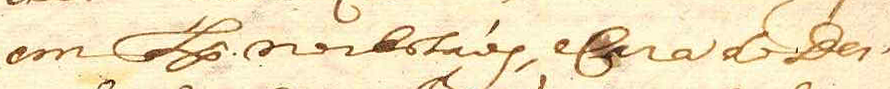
em Lx. nos Estaós, e Caza do Des
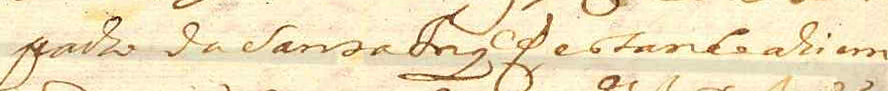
pacho da Santa Inqçaõ, estando ahi em
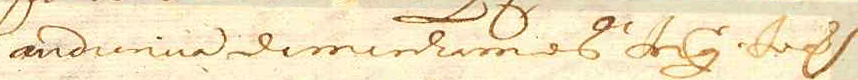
audienca de menham o sor Inqr Ioaõ
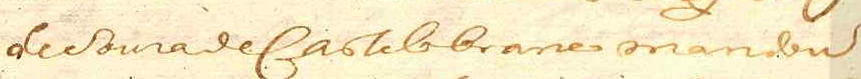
de Souza de Castelo branco mandou
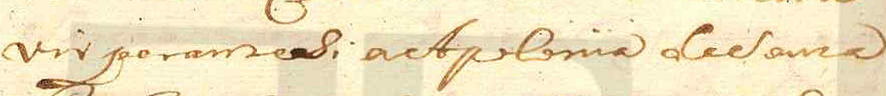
vir perante si a Apolonia de souza
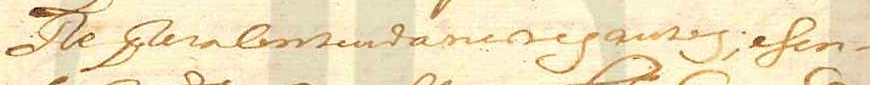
Re pReza conteuda nestes autos; e sen
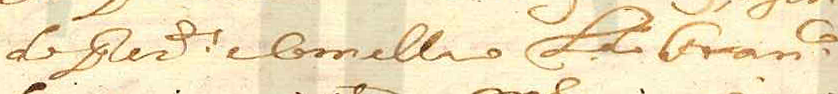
do pRez.te e Com ella o Ldo Franco.
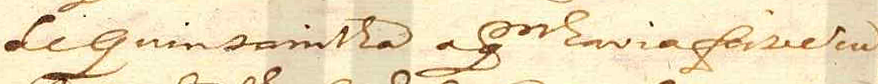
de quintanilha a qm havia feito seu
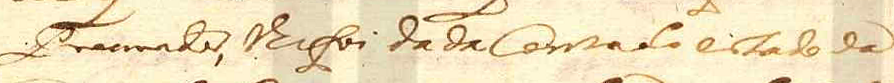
Procurador, lhe foi dada Conta do estado da
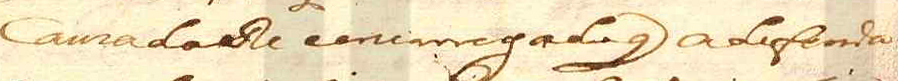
Cauza da Re e encarregado q̄ a defenda
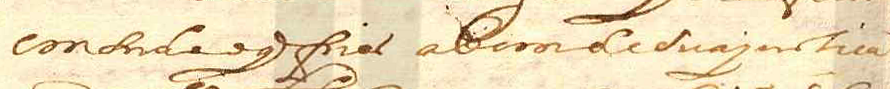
em tudo o q̄ fizer a bem de sua justiça
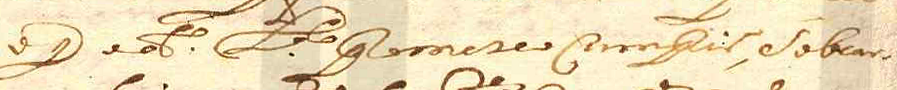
o q̄ o d̄.o L.do pRometeo Cumprir, Sob car
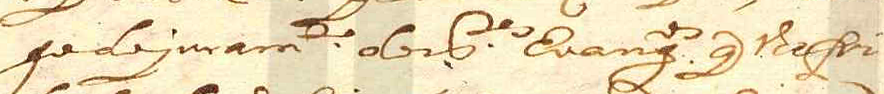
go do juram.to dos s.tos Evang.os q̄ lhe foi
